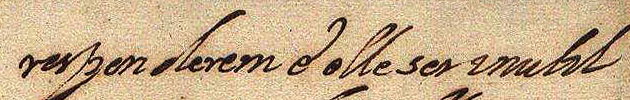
responderem e elle ser inutil
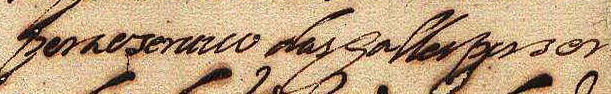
pera o seruico das galles por ser
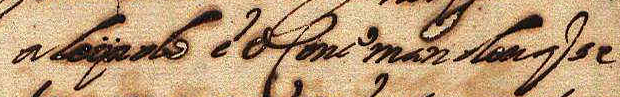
aleijado e o Conco mandou q̄ se
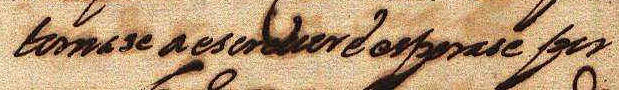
tornase a escreuer e esperase por
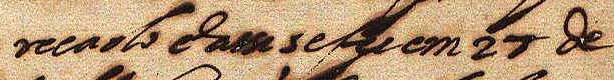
recado e assi se fez em 27 de
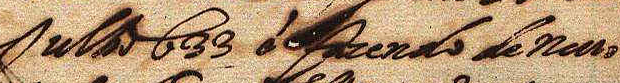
Julho 633 e fazendo de nouo
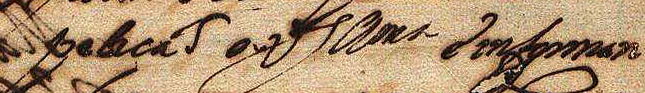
petiçaõ a V Jllma e informan
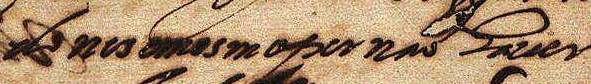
do nos o mesmo por naõ hauer
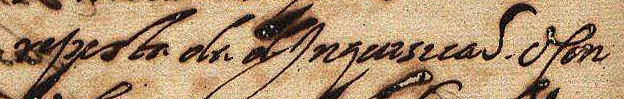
reposta da d̄ Jnquisiçaõ o Con
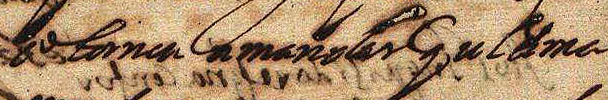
co tornou a mandar q̄ ultima
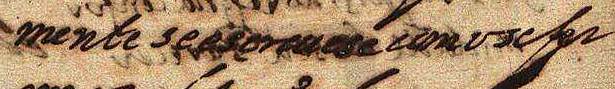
mente se escreuese como se fez
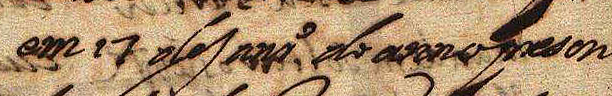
em 17 de Janro do anno presen
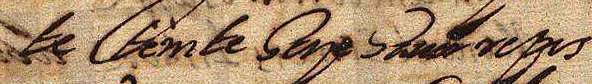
te temte hoije hauer repos
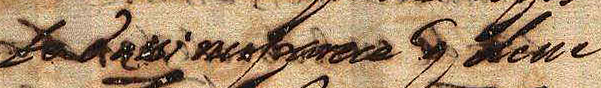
to e assi nos parece q̄ deue
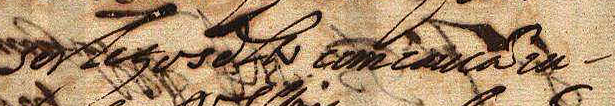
ser logo solto com cauçaõ iu
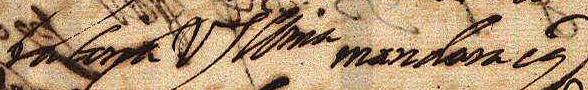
ratoria V Jllma mandara o q̄
